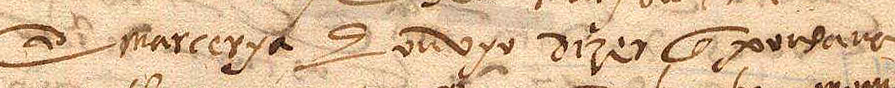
ē marcerya E ouvyo dizer q̄ pousaua
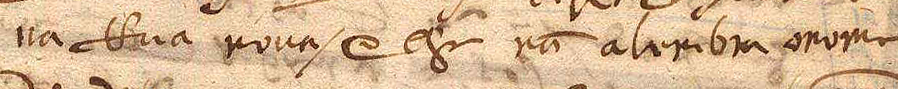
na Rua noua / e lhe nā alembra o nome
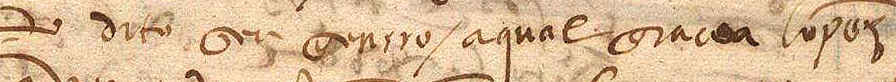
do dito seu genrro / a qual gracea lopez
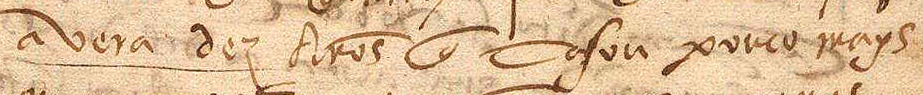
avera dez An̄os q̄ Casou pouco mays
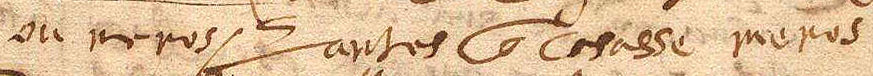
ou menos / E antes q̄ casasse menos
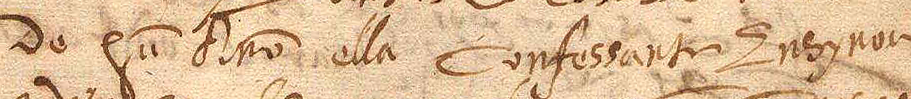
De hū An̄o ella Confessante Ensynou
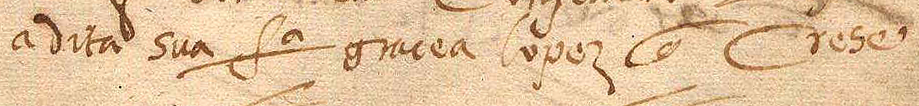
a dita sua fa gracea lopez q̄ Crese
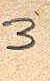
3
